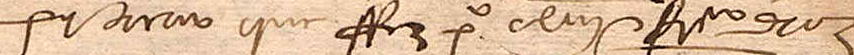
pytição que ffez po āluz e frco diaz
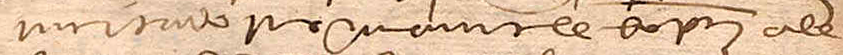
mercadores e manuell lopez all
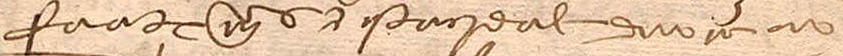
faate mos ē esta cjdade deuora ao
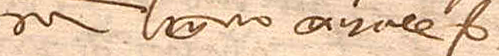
s̄or vigro gerall
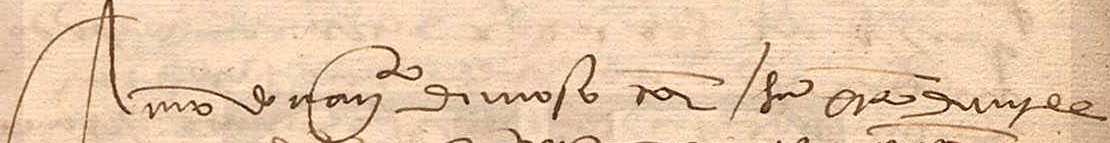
Anno do namto de noso s̄or Jhū x̄po de mjll
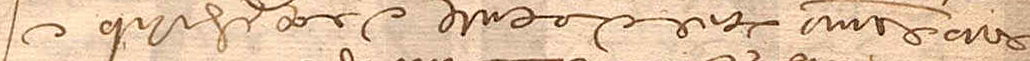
e qujnhētos e trinta e sete ānos aos
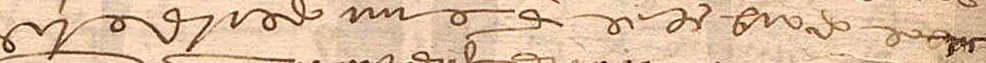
sejs djas do mes de setēbro do sobre
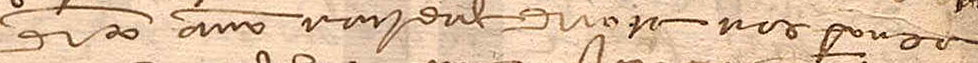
dito āno na cjdade deuora nas pousa
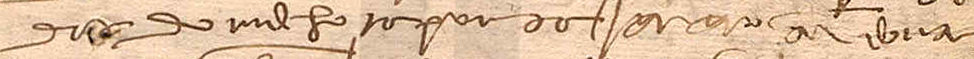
das domde hora pousa Jgregio s̄or doutor
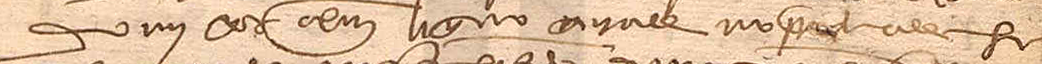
domjgos āluz vigro gerall no sp̄tuall he
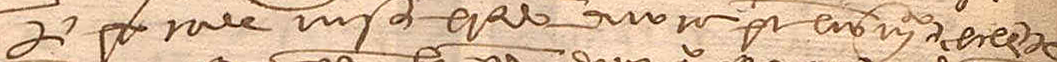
tēporall neste b̄pdo deuora pelo mto ēclellēte
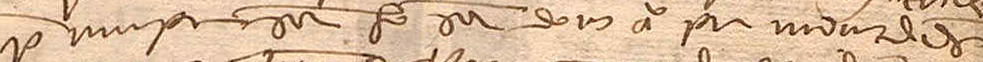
p̄ncepe s̄or ho s̄or dom ao por mēçe de d̄s
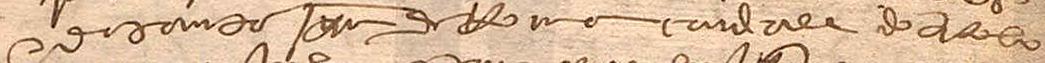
e da santa Jḡra de Roma cardeall do titolo
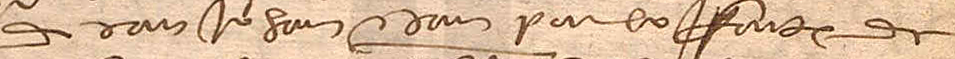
de sam Joham e sam paulo Jfante de
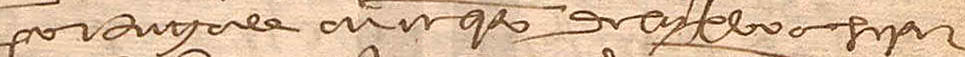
portugall ar̄cebpo de lyxboa he per
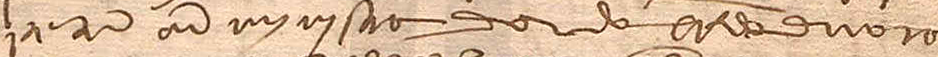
petū admjnjstrador do b̄pdo deuora
